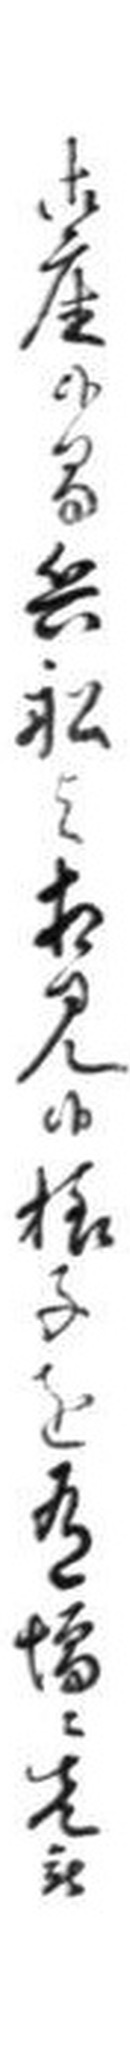御座候間兵船与相見候様子を有増ニ先被
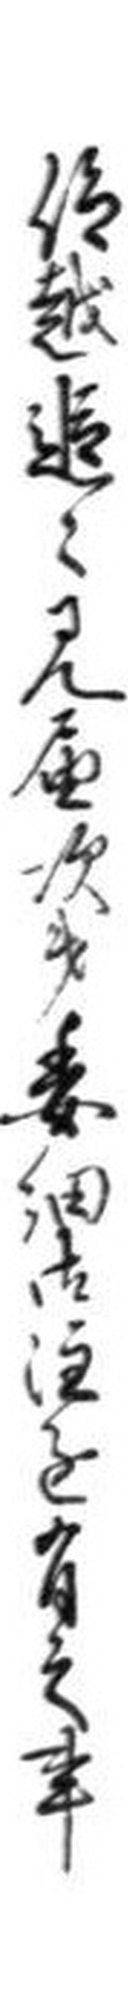仰越追々見届次第委細御注進有之事
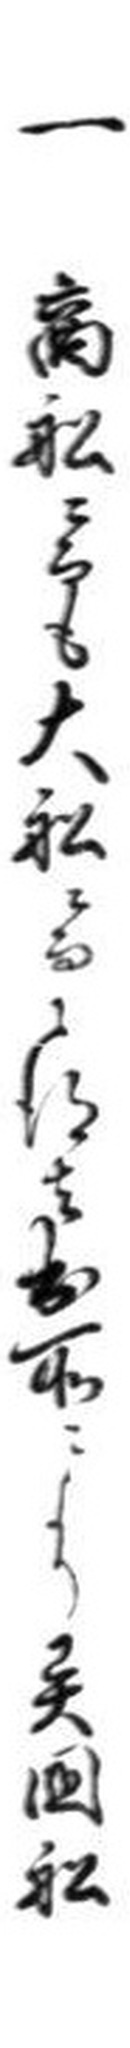一商船ニ而も大船ニ而候得者出所ニより異国船
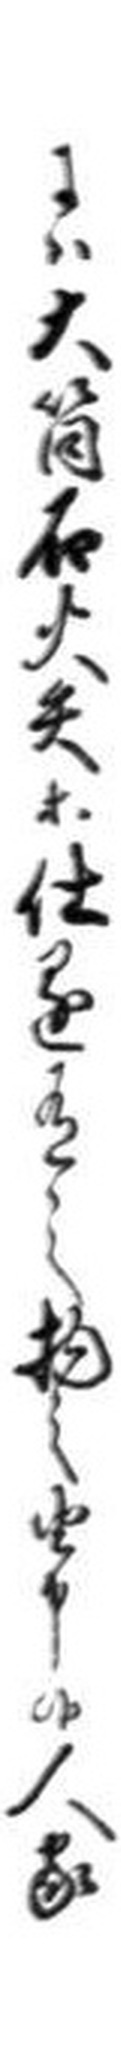にハ大筒石火矢等仕懸有之物之由申候人家
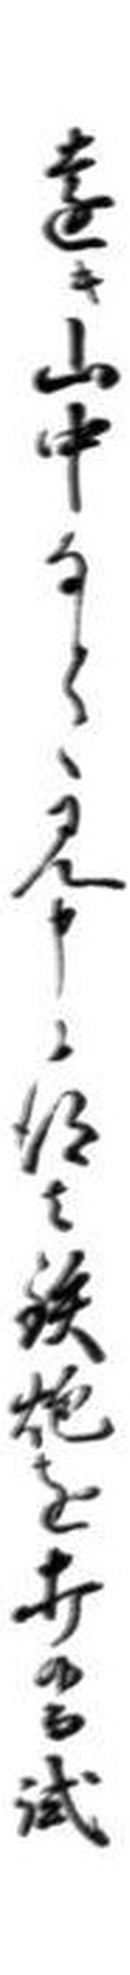遠キ山中なとゝ見申候得者鉄炮を打候而試
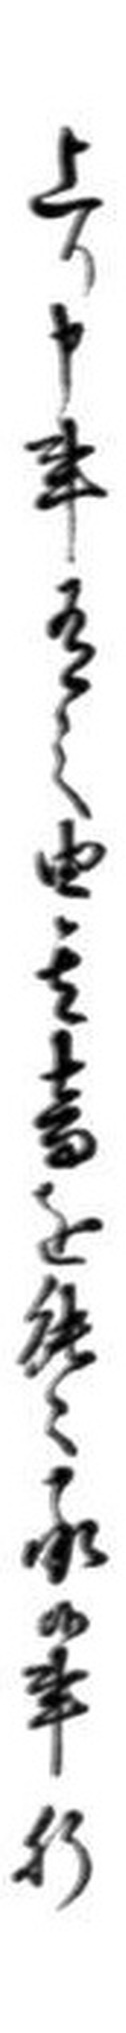上り申事有之由其音を能々承候事肝
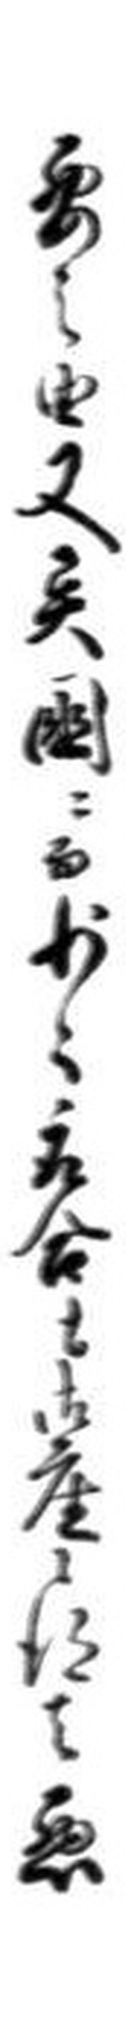要之由又異国ニ而少々取合も御座候得者悪
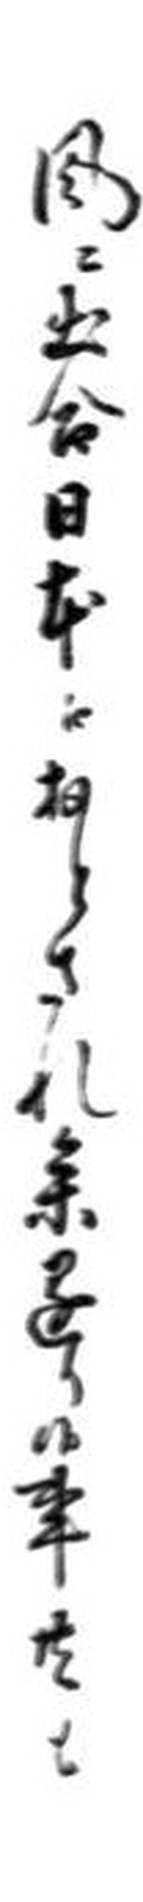風ニ出合日本江おとされ参懸り候事共も
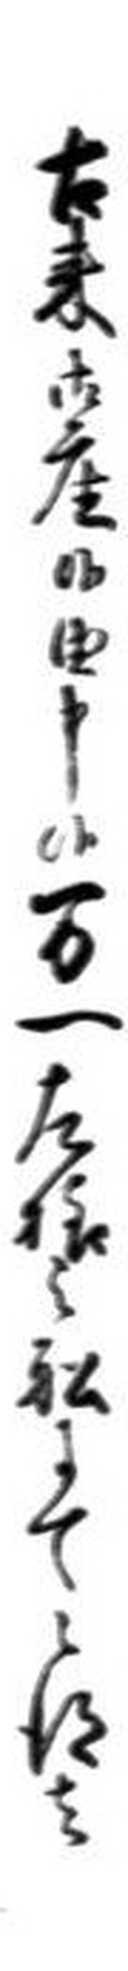古来御座候由申候万一左様之船にて候得者
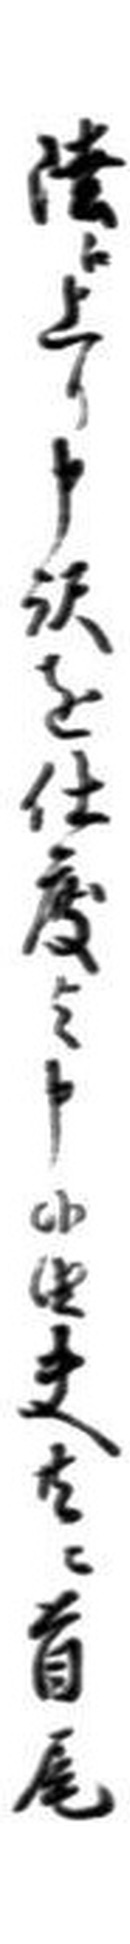陸江上り申訳を仕度与申候由夫共ニ首尾
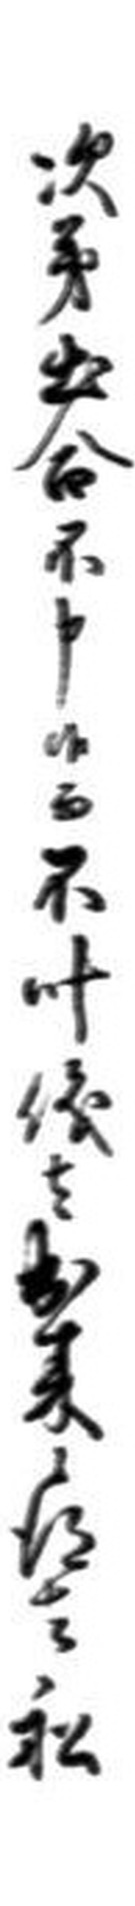次第出合不申候而不叶儀者出来候得者私
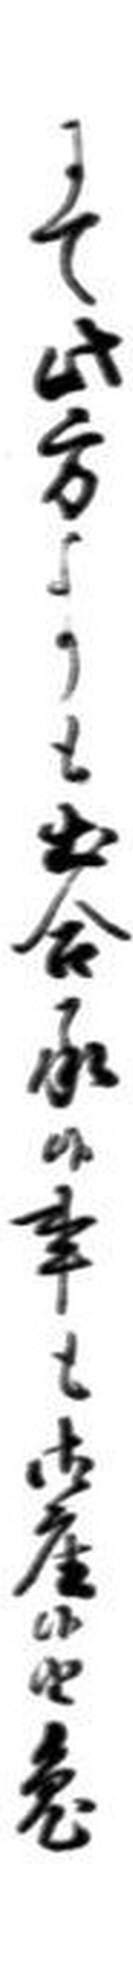にて此方よりも出合承候事も御座候由兎
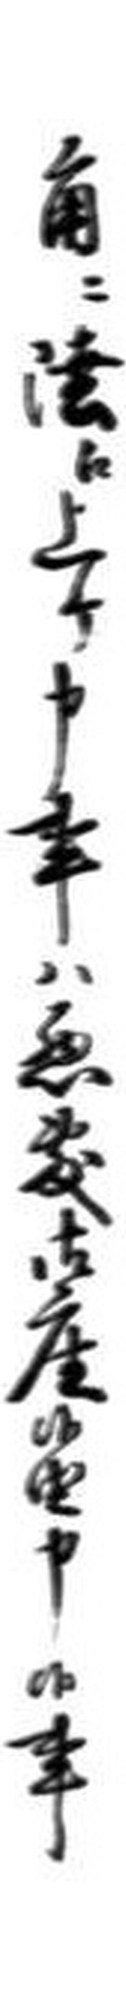角ニ陸江上ケ申事ハ悪敷御座候由申候事

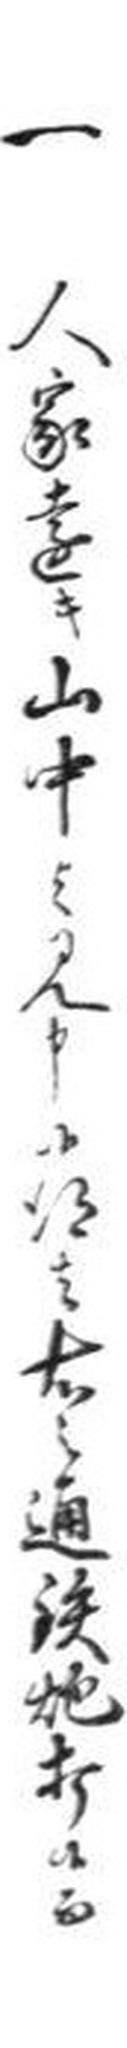一人家遠キ山中与見申候得者右之通鉄炮打候而
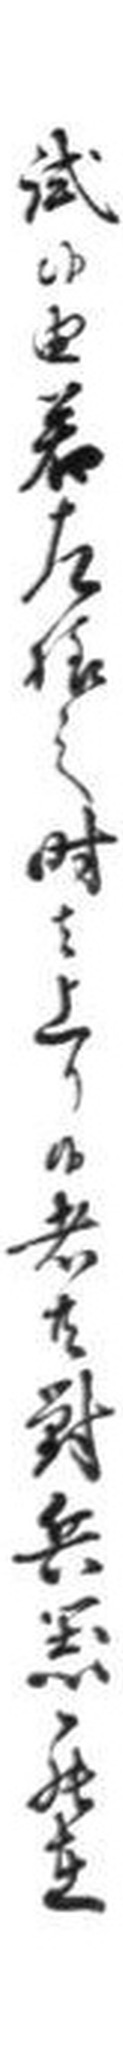試候由若左様之時者上り候者共対兵器罷在
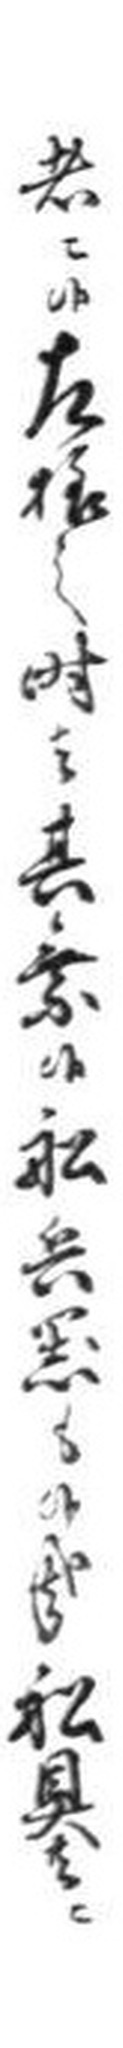者ニ候左様之時者其乗候船兵器も候哉私具共ニ
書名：家譜 三十二 吉邦公 従享保二年到享保三年
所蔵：福井県文書館 Fukui Prefectural Archives
